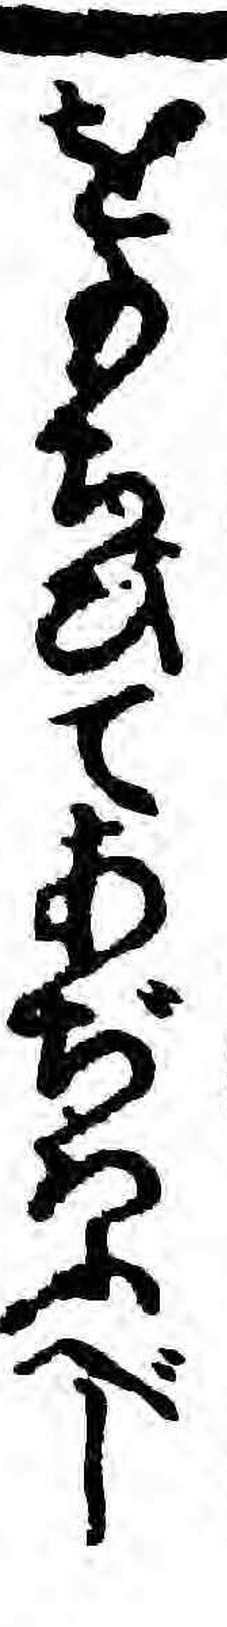をもちひてあぢはうべし

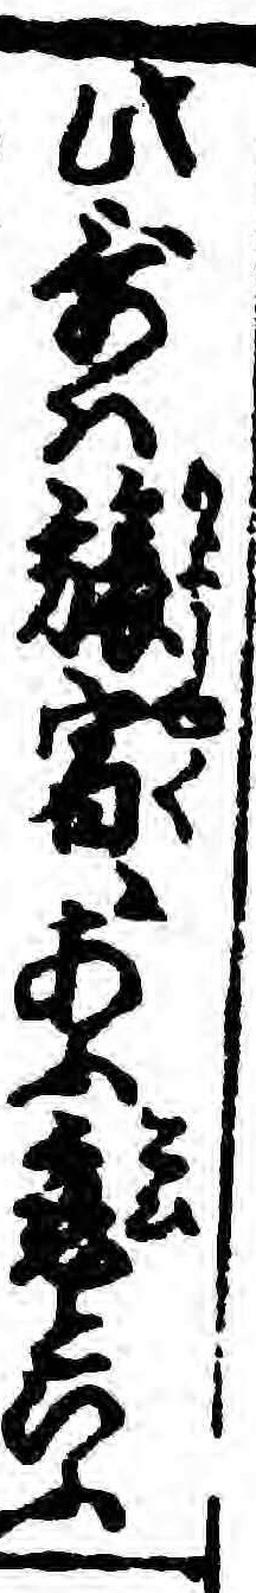此哥は旅宿にあふ恋といふ
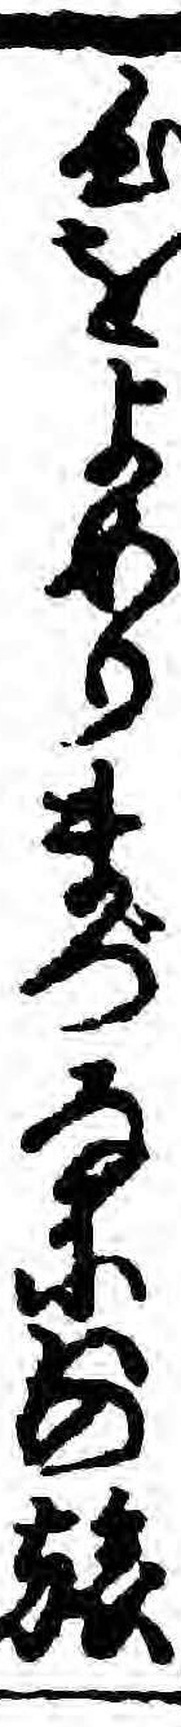心をよめりまづなにはの旅
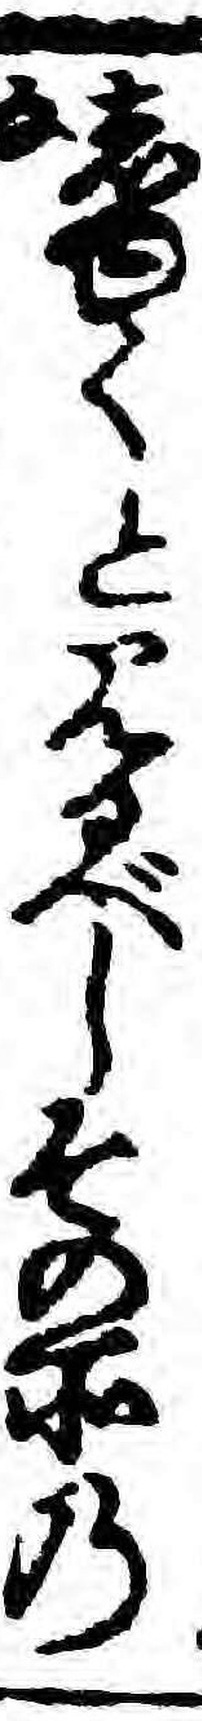しゆくと見るべしその所の
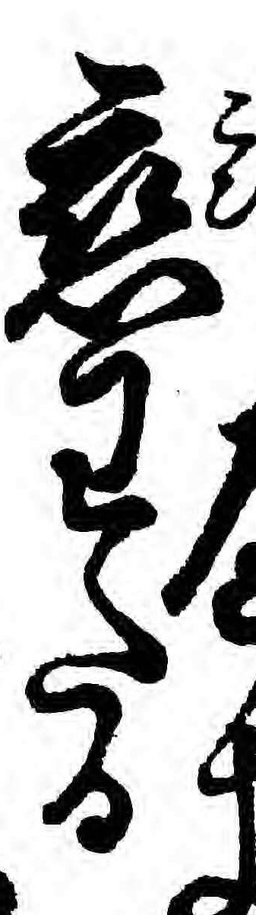恋わたる
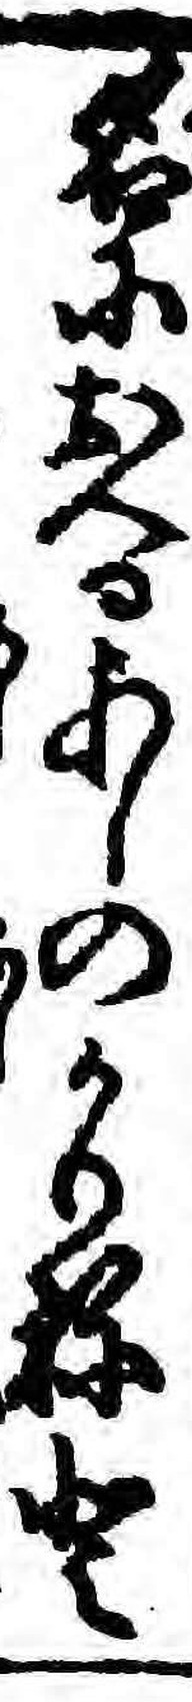名におへるあしのかりねと
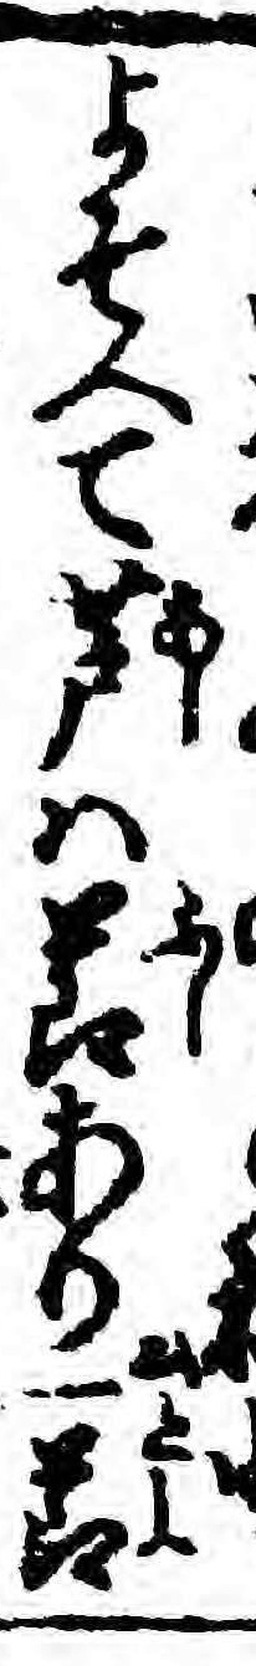よそへて芦は節あり一節
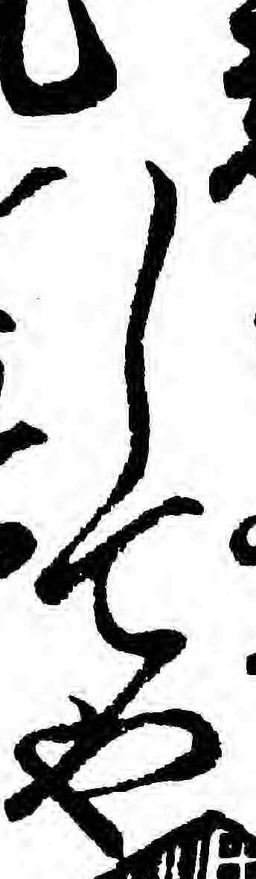してや
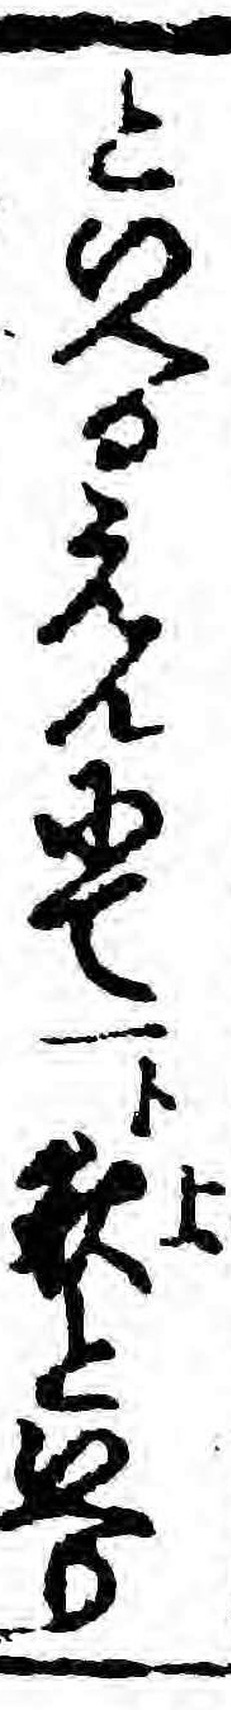といへるえんにて一ト夜といへり
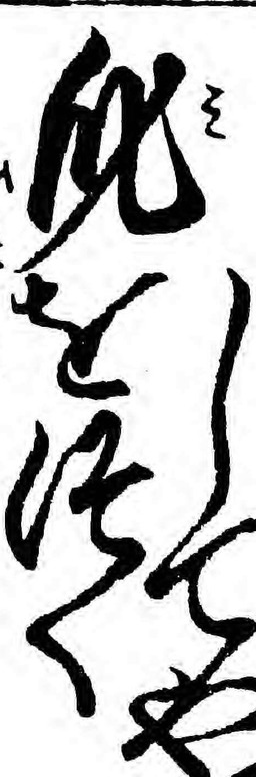身をつく
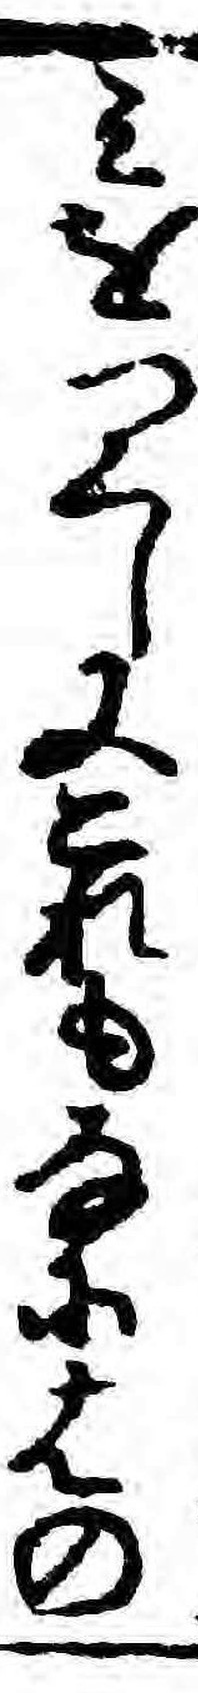みをづくし又これもなにはの
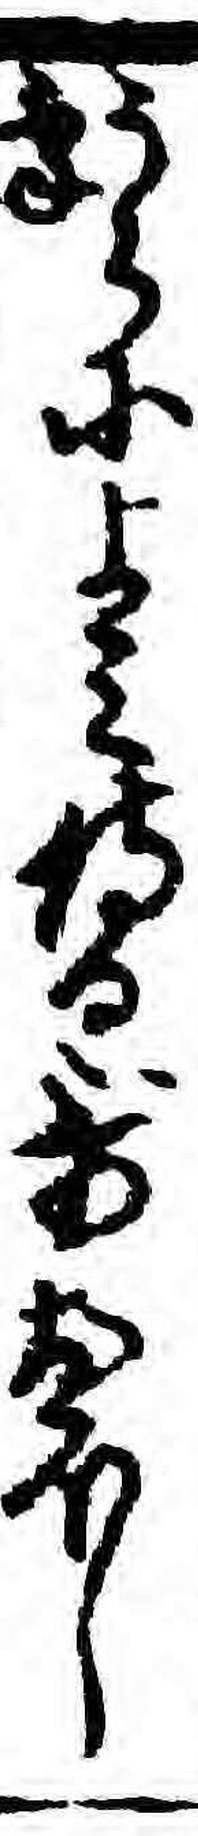うらによみ侍る哥おほし
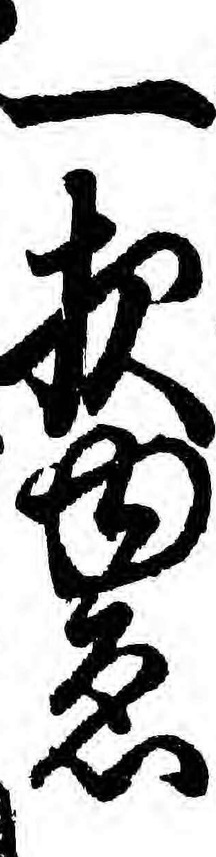一夜ゆゑ
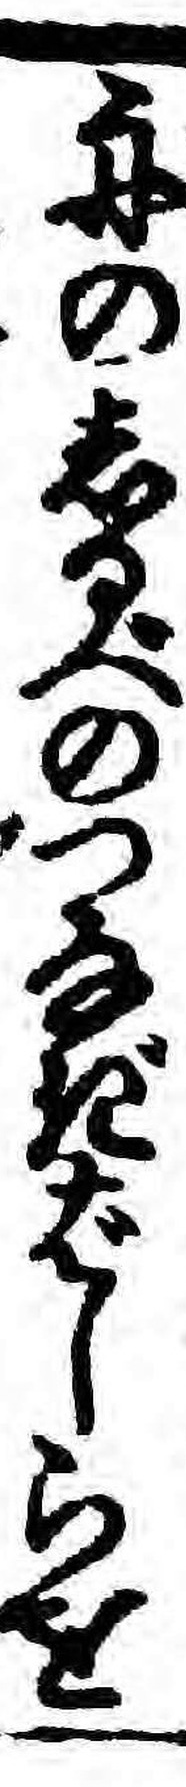舟のしるべのつなぎばしらを
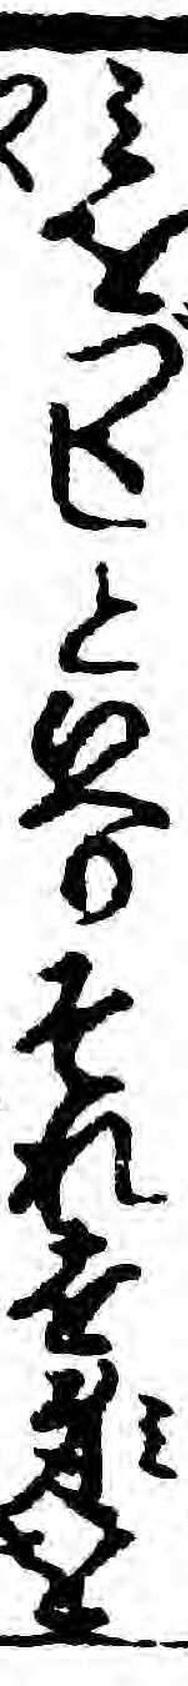みをづくしといへりそれを身を
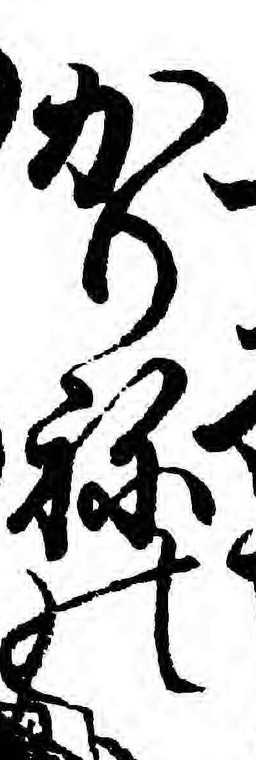かりねの
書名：頭書和歌注譯／壽賀多百人一首小倉錦
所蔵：国文学研究資料館
